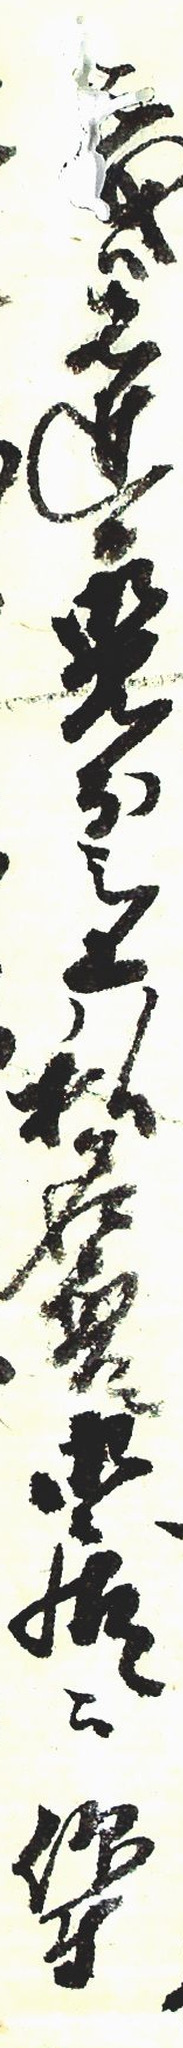之義は先達て御見分之上私名負に御居に被仰付
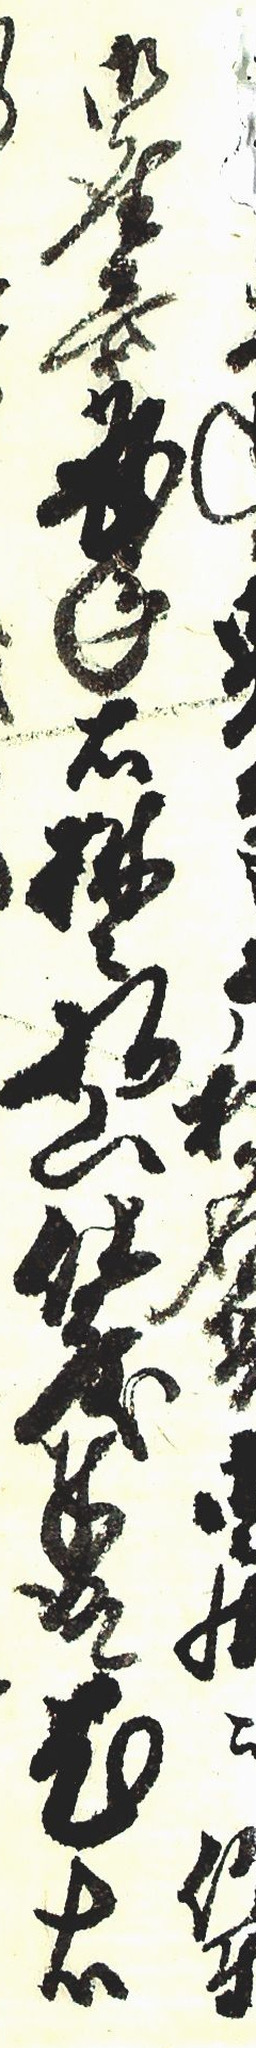御座候所当年右株に払山仕度奉存候尤右
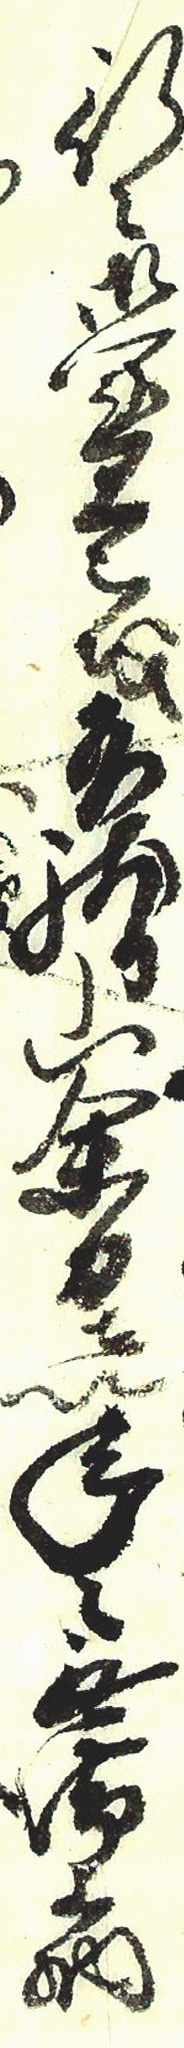行々御運上之義外残り山余力を以年々無滞上納
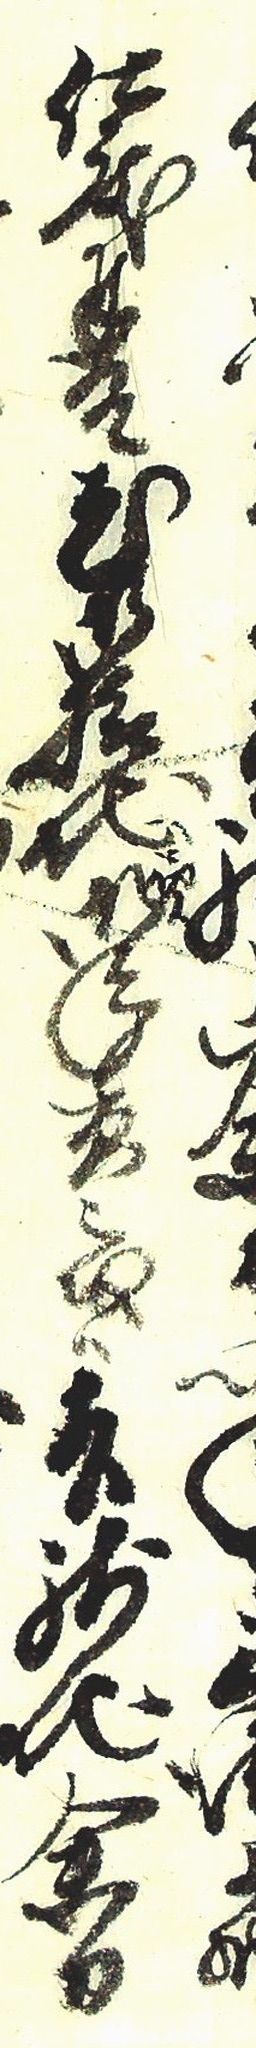仕度奉存候尤御検地御年貢之儀は外残地余力
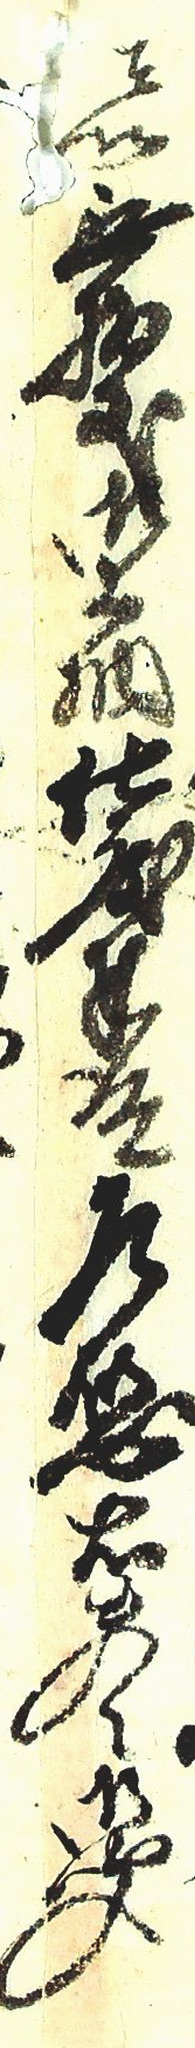を以無指支御上納仕度奉存候乍恐右夫々御聞
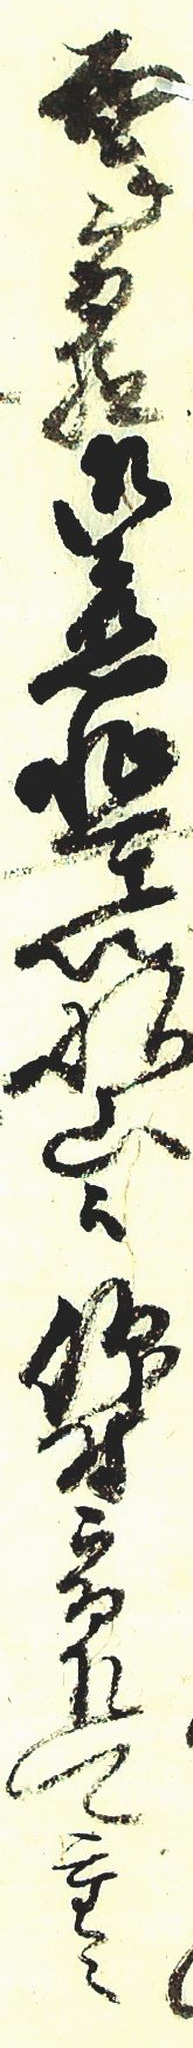届け被為遊御慈悲を以払山被仰付被為下候はゝ重々
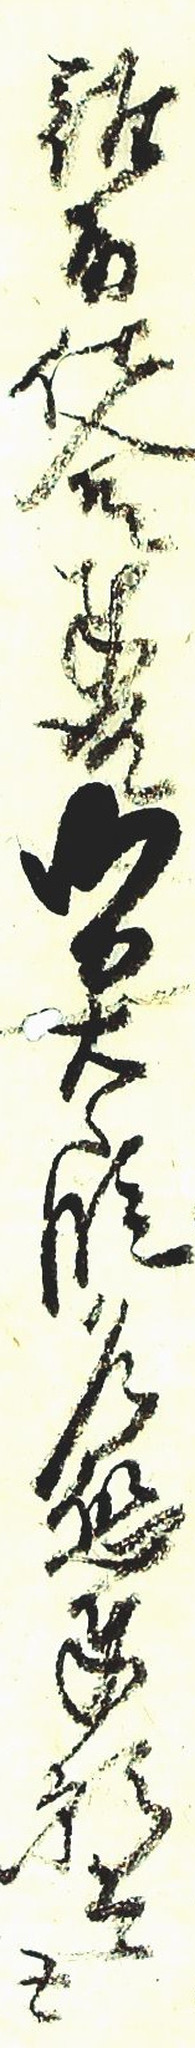難有仕合に奉存候仍て右之段乍恐奉願上候以上
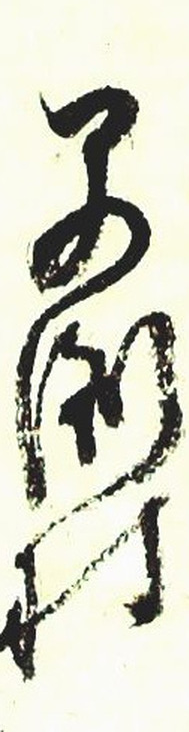早淵村
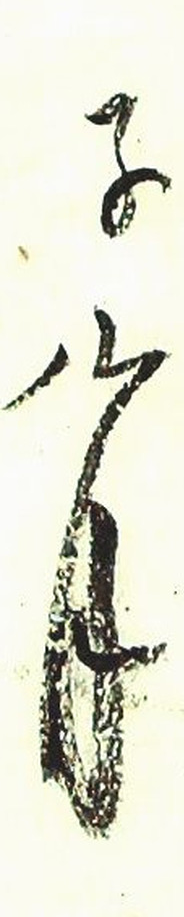子八月
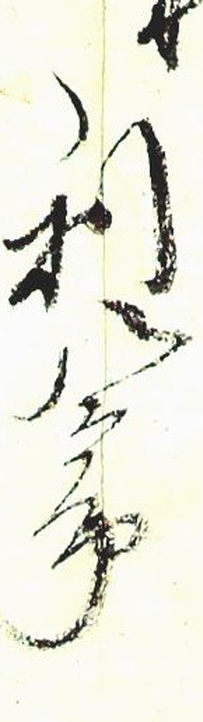利八郎
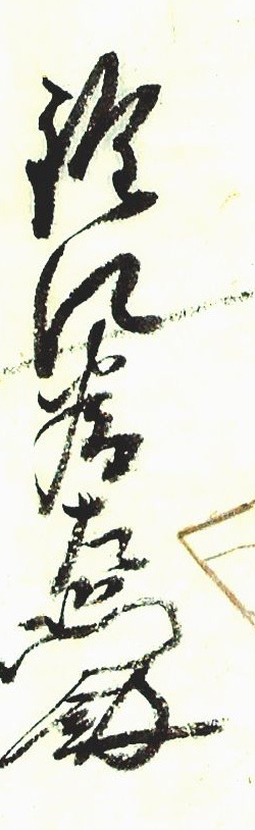鈴江為左衛門殿
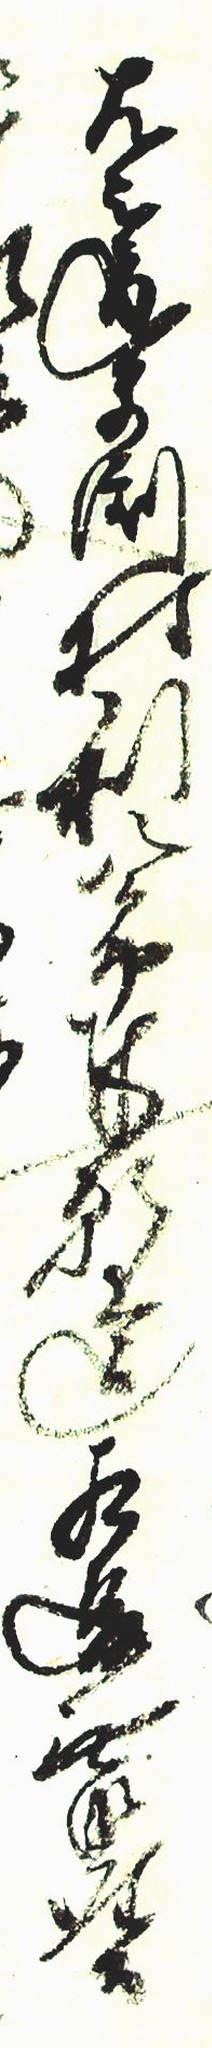右之通早淵村利八郎奉願上通相違無御座候
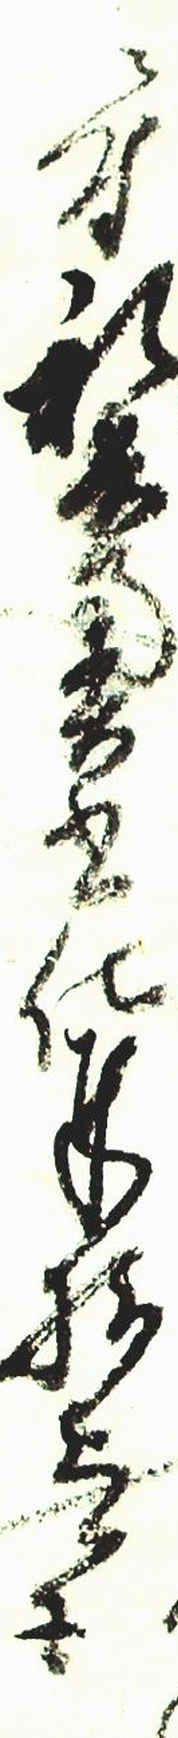に付私共奥書仕奉指上候以上
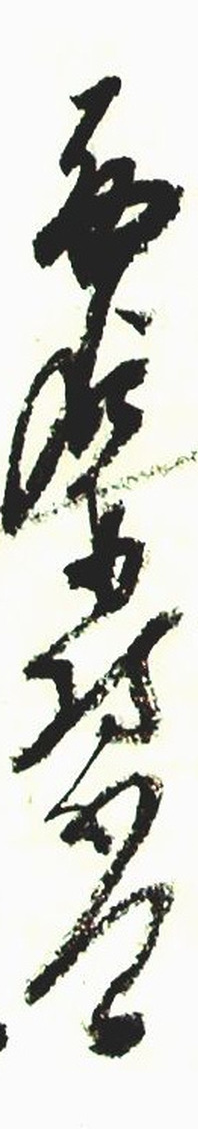東名東村五人与
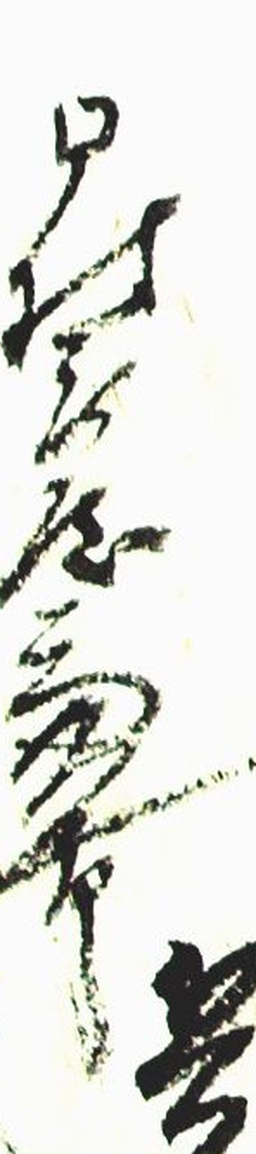同村庄屋兼帯
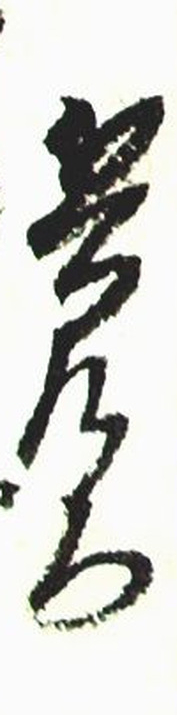兵左衛門
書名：諸御願書控(弐番）
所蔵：鳴門教育大学 Naruto University of Education
